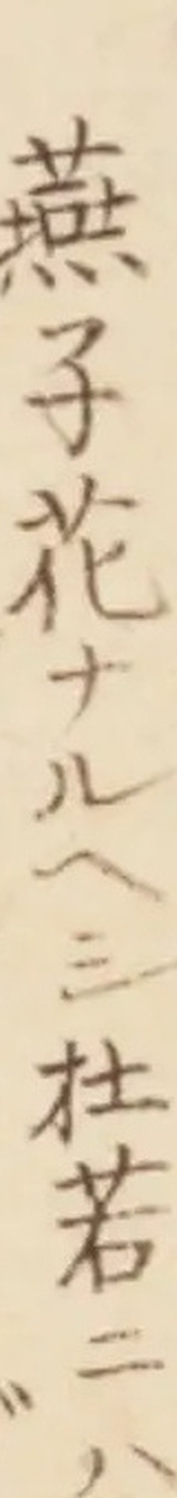燕子花ナルヘシ杜若ニハ
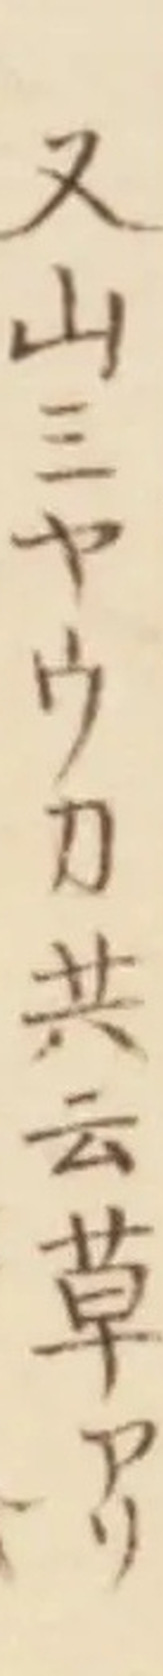又山ミヤウカ共云草アリ
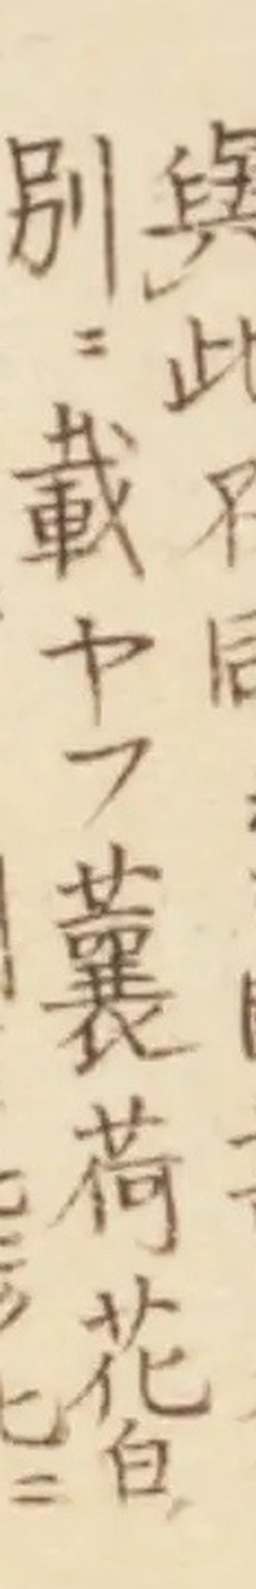別載ヤフ蘘荷花白
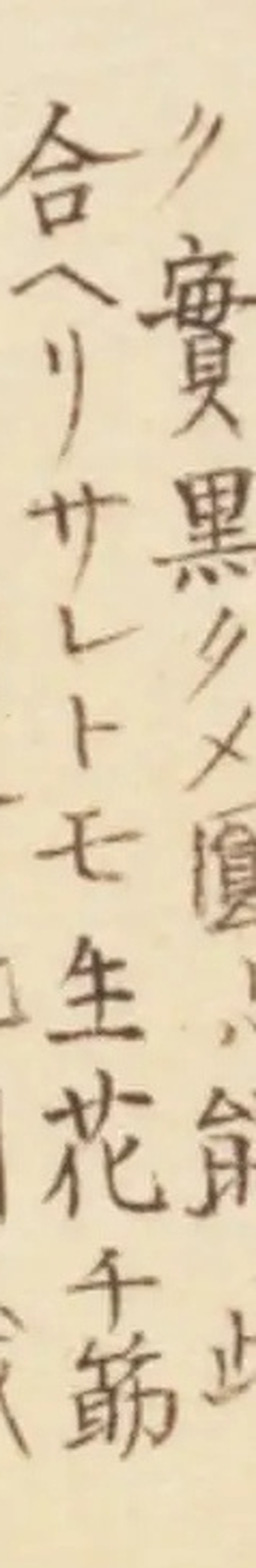合ヘリサレトモ生花千筯
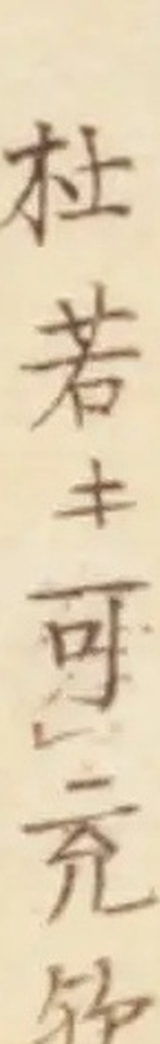杜若キ可充歟
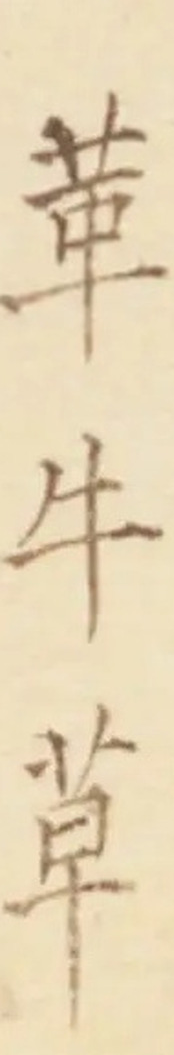革牛草
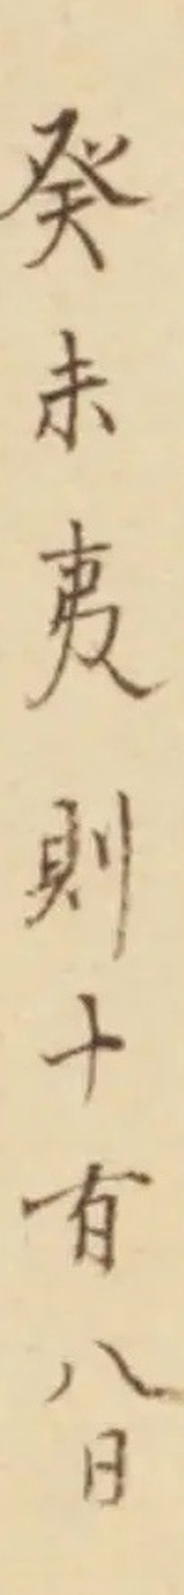癸未夷則十有八日
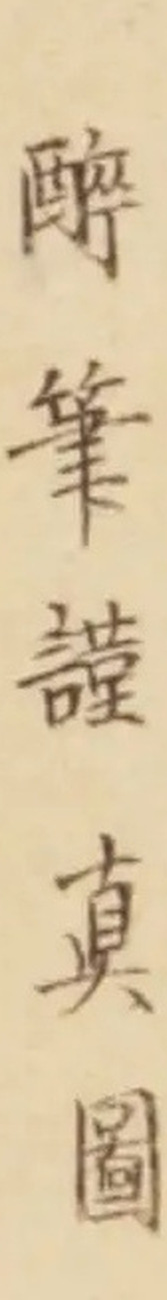酔筆謹真図

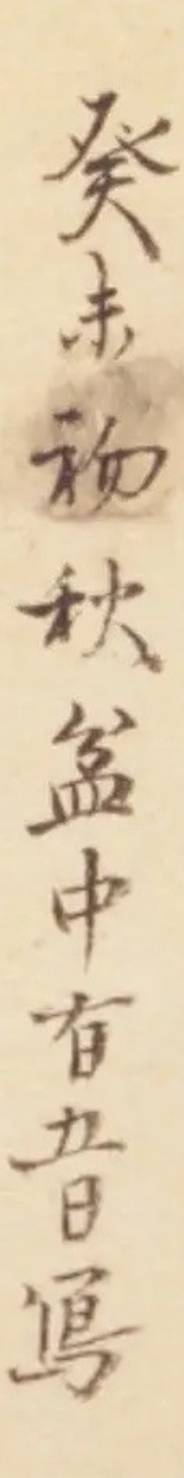癸未秋盆中有五日写
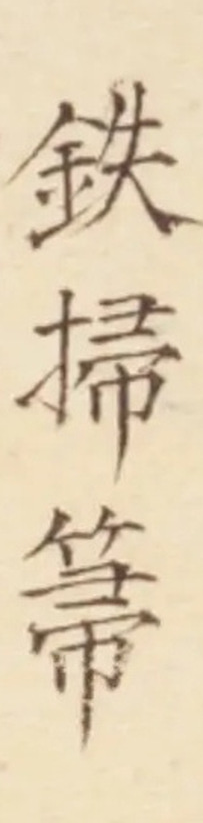鉄掃箒
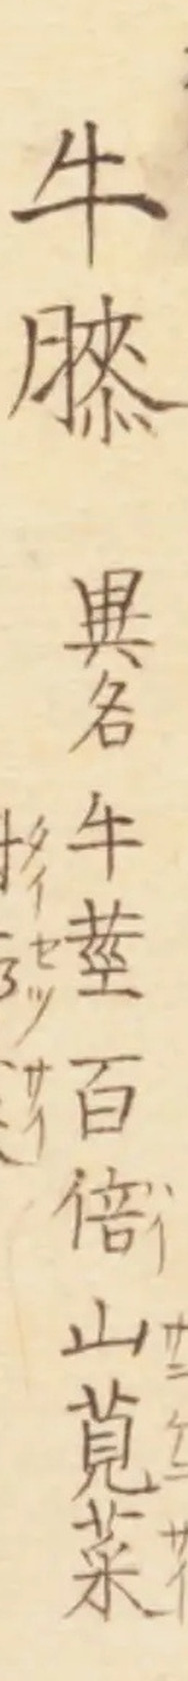牛膝異名牛茎百倍山莧菜
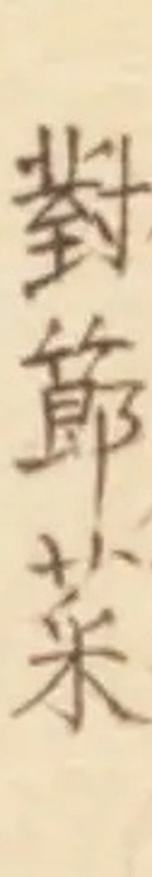対節菜
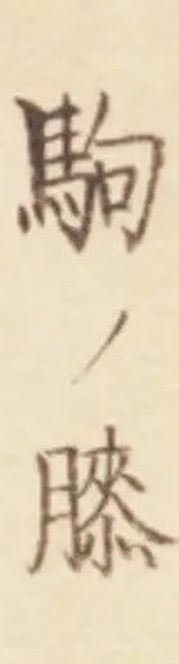駒ノ膝
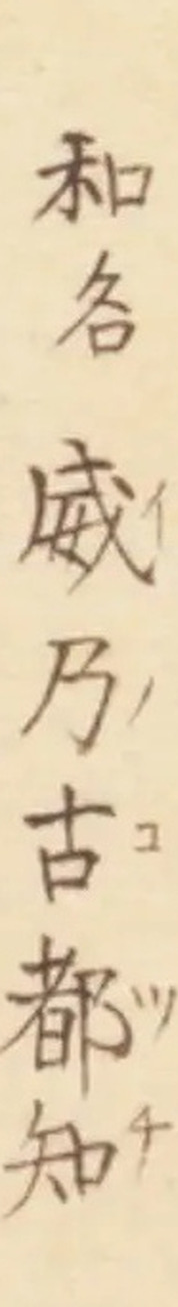和名威乃古都知
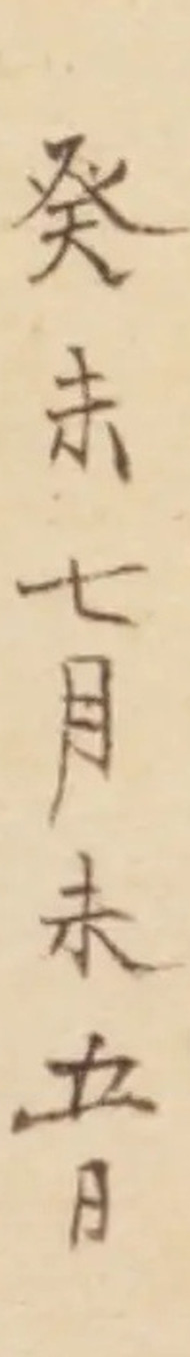癸未七月未五日

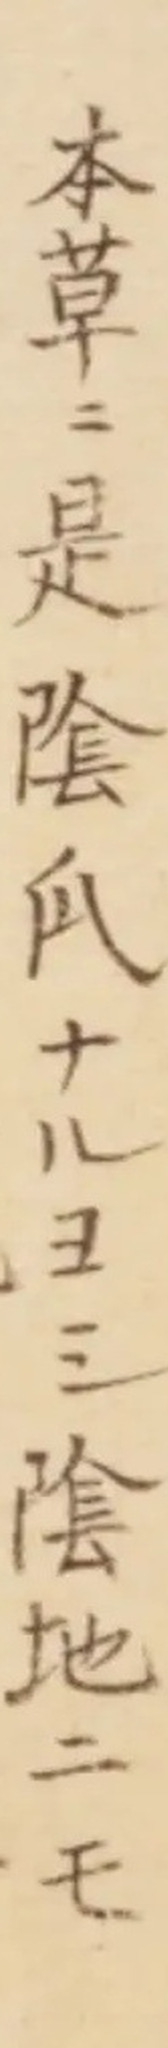本草是陰瓜ナルヨシ陰地ニモ
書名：梅園草木花譜秋之部. 1
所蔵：国立国会図書館 National Diet Library, JAPAN
